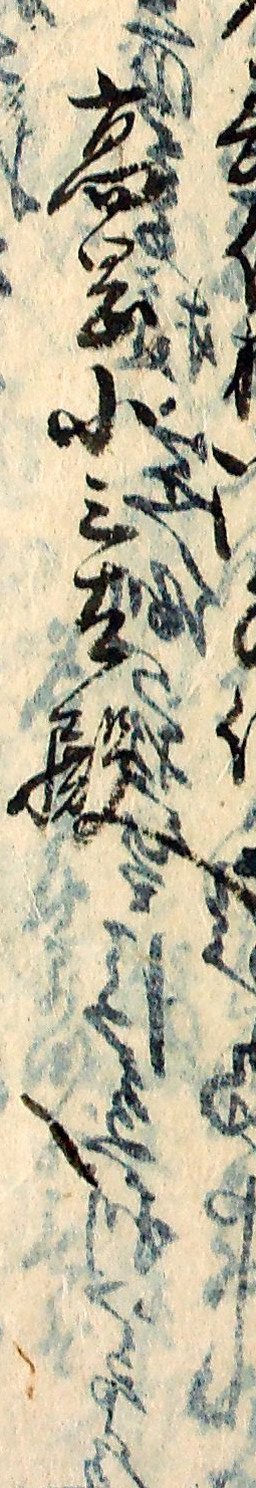高岡小三太殿

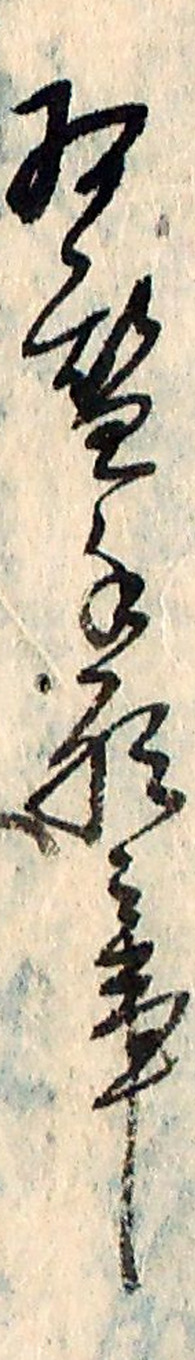為替手形之事
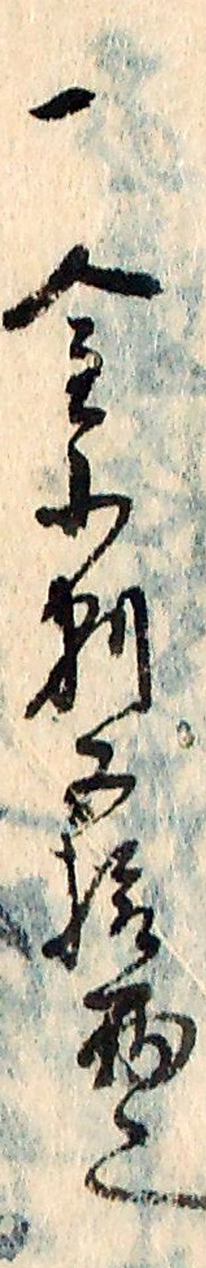一金小判五拾両也
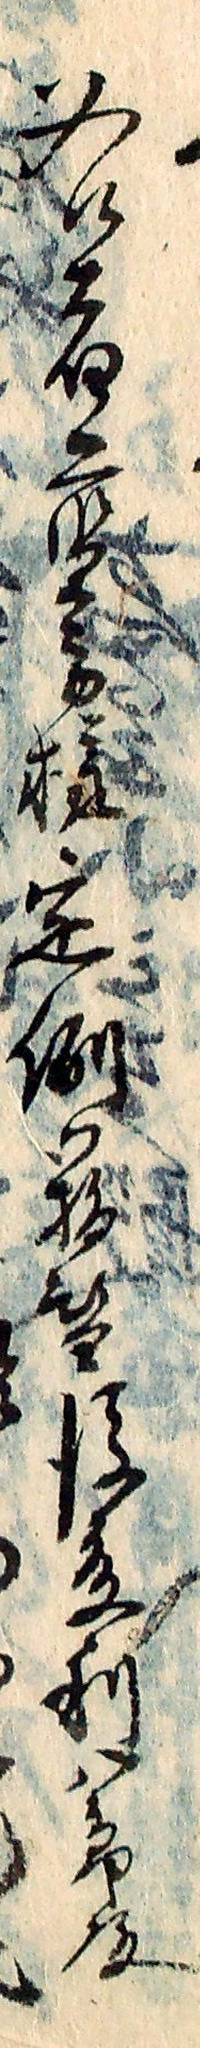右は藍方様定例御指替後藤利八郎殿
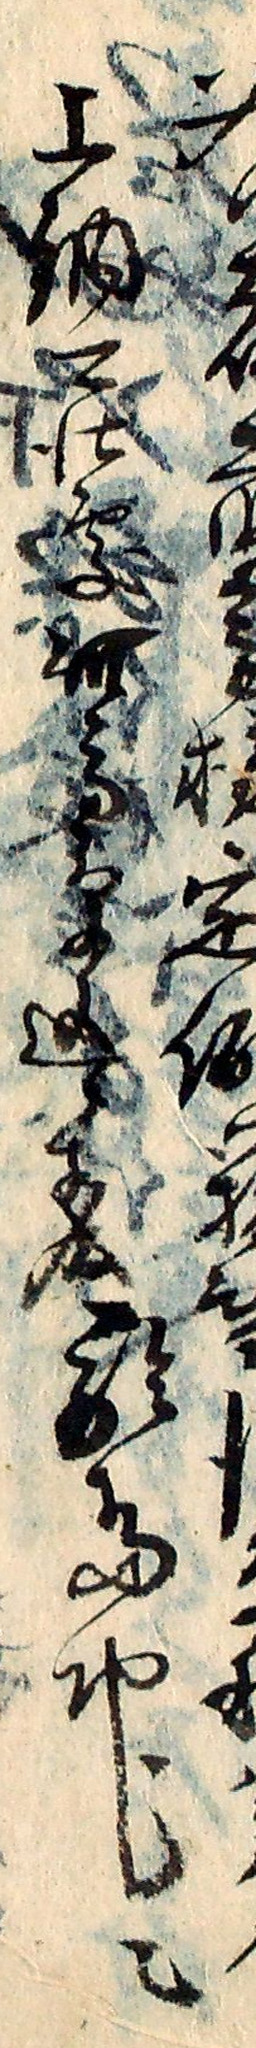上納可仕処此方受込に相成於当宅に
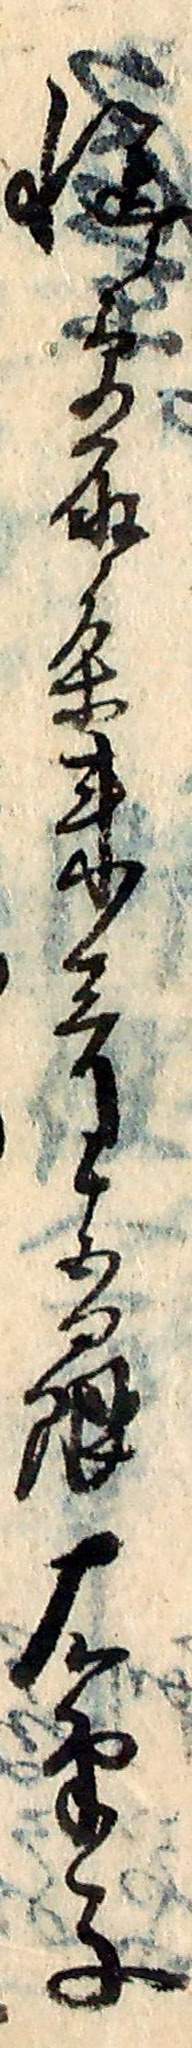慥に受取候条来三月十五日限右金子
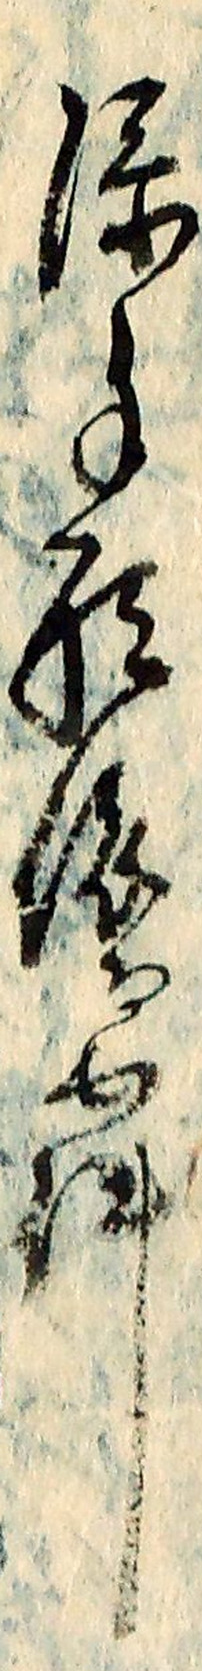添手形依て如件
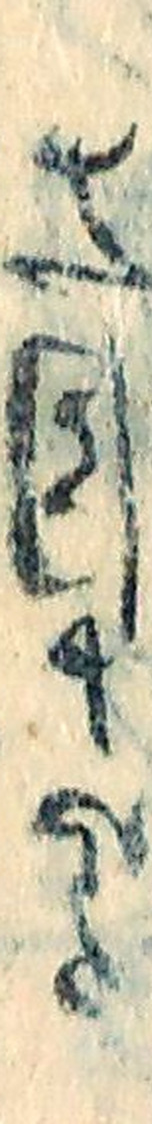十一月
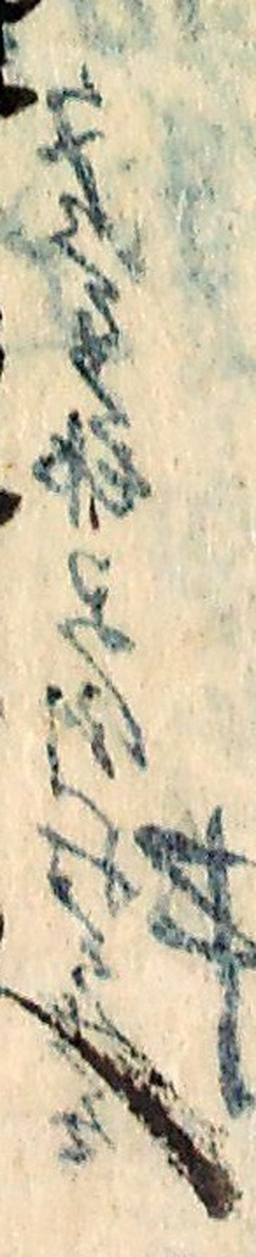十一月
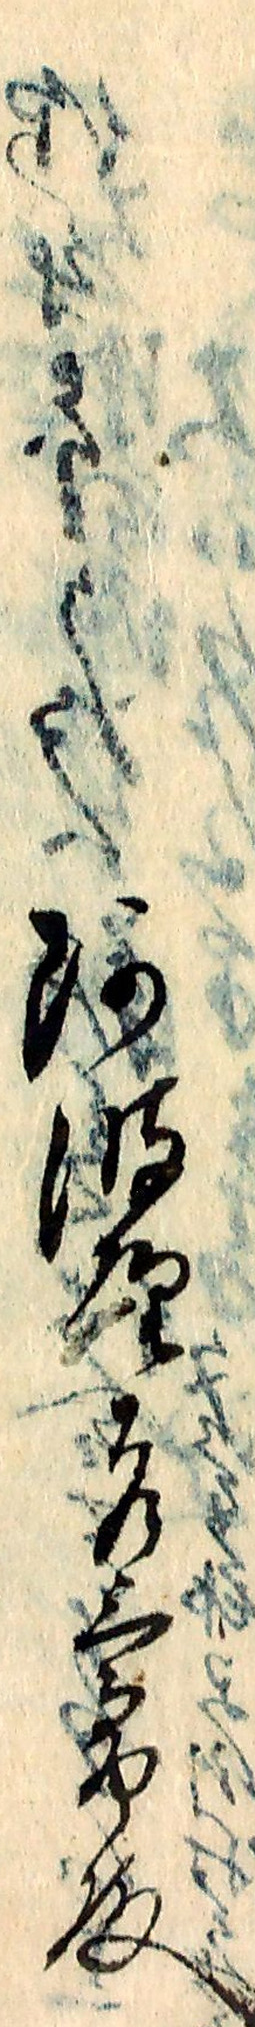阿波野彦三郎殿
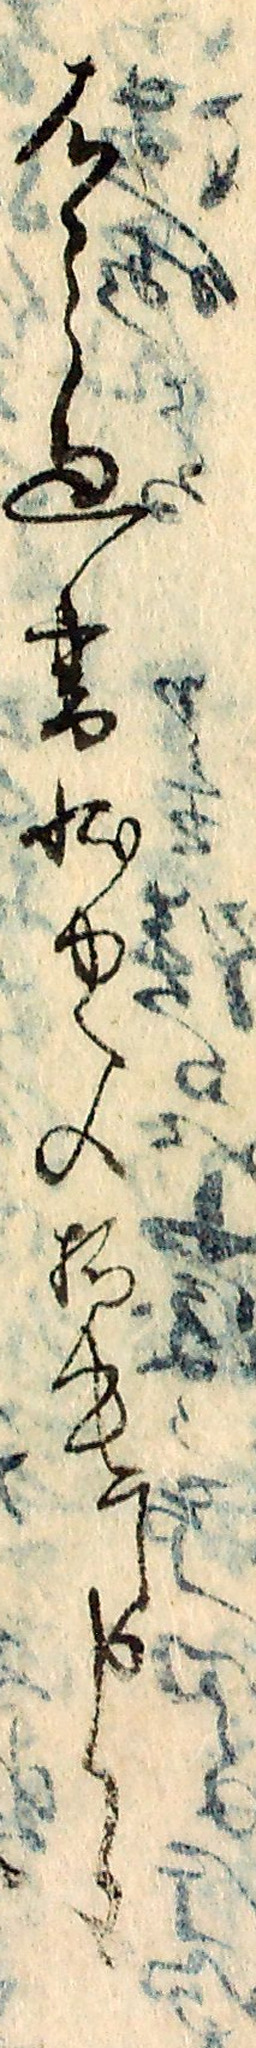右之通書状受指遣し申候以上

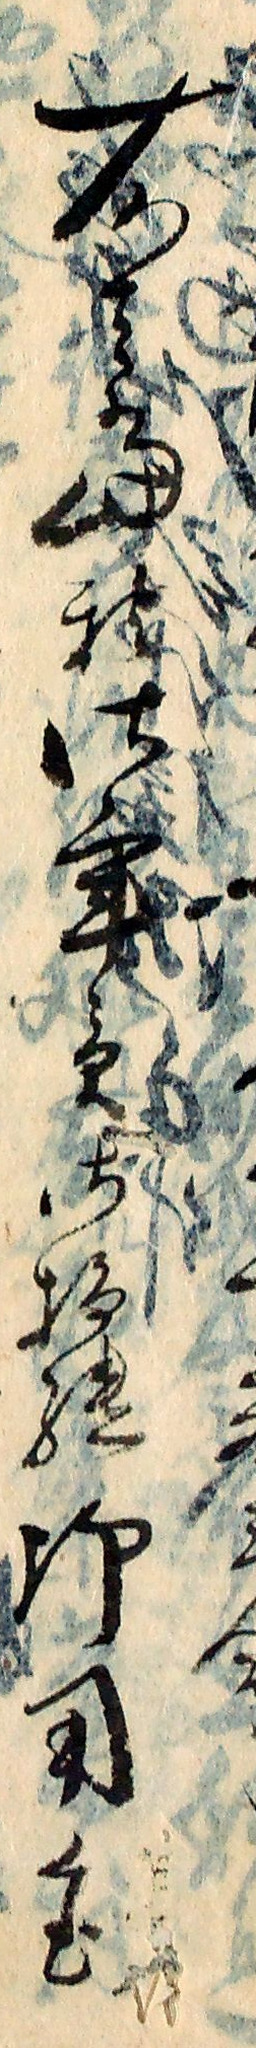右は当秋御年貢御指継御用金
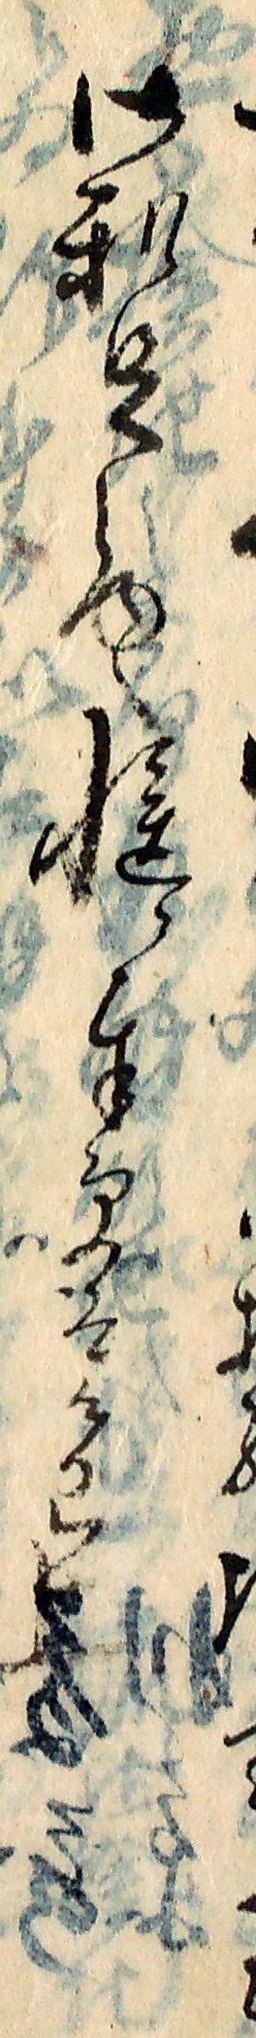御利足之内へ慥に奉受取候已上
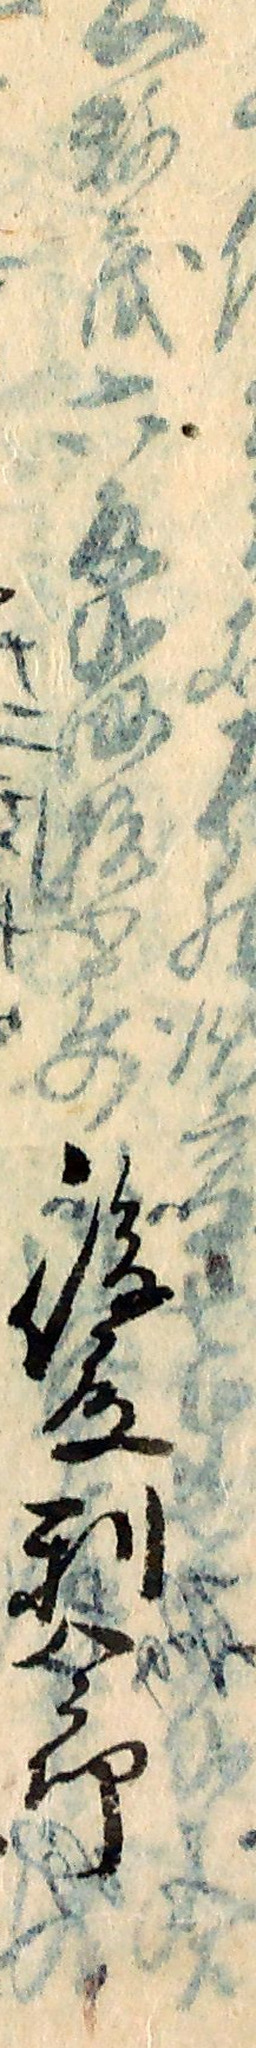後藤利八郎
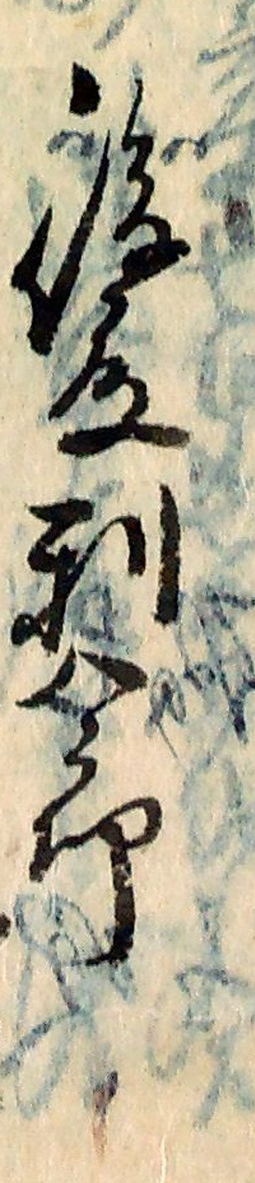後藤利八郎
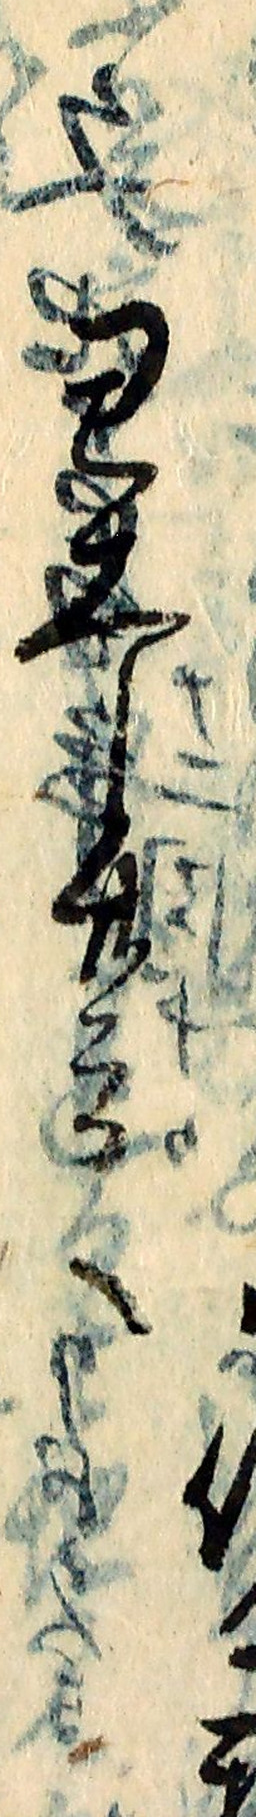丑十一月廿二日
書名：諸御願書控(後藤氏壱番）
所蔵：鳴門教育大学 Naruto University of Education
